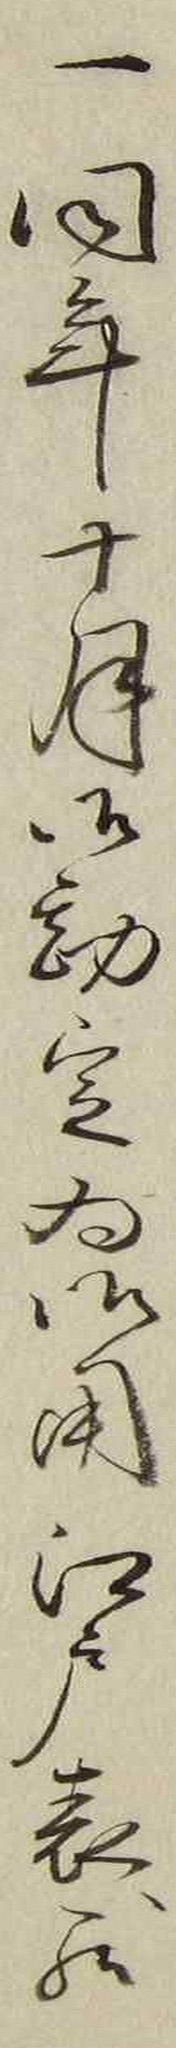一同年十月御勘定為御用江戸表へ罷

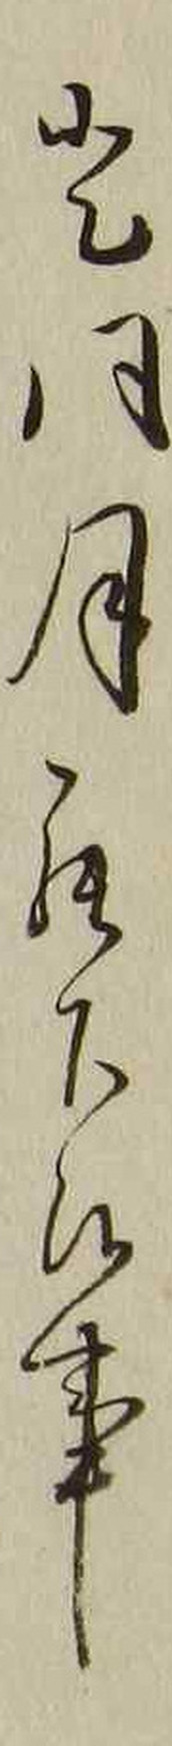登同月罷下候事
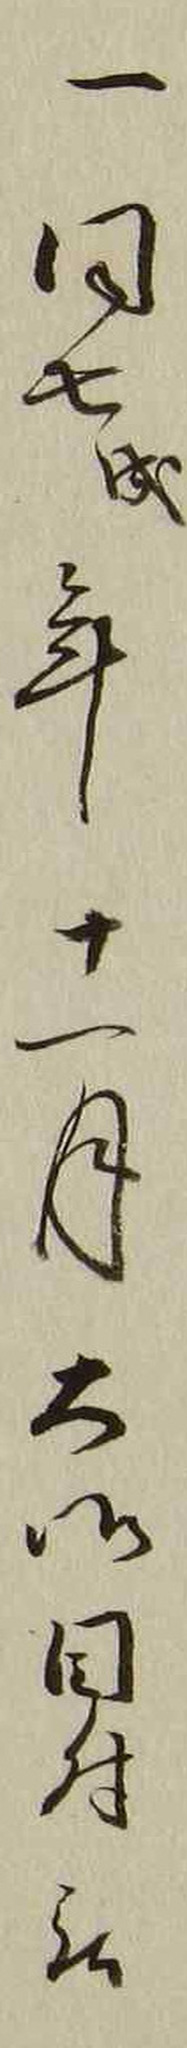一同七戌年十一月大御目付被
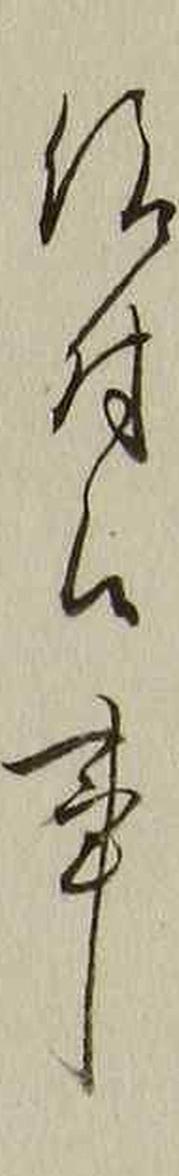仰付候事
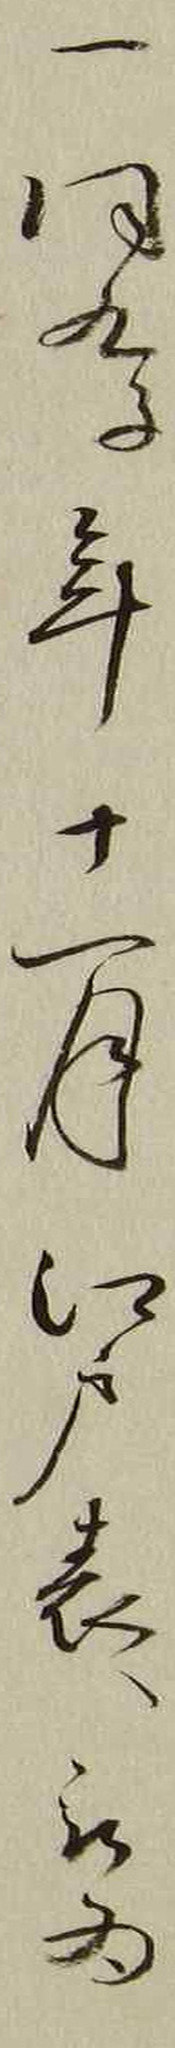一同九子年十一月江戸表へ被為
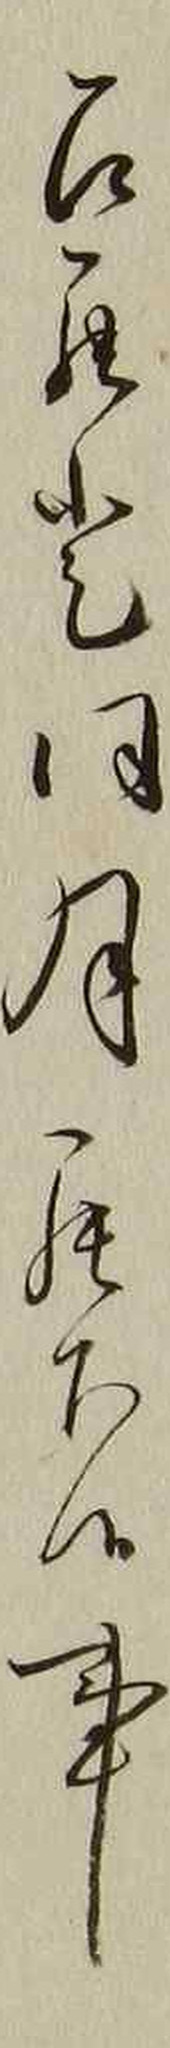召罷登同月罷下候事
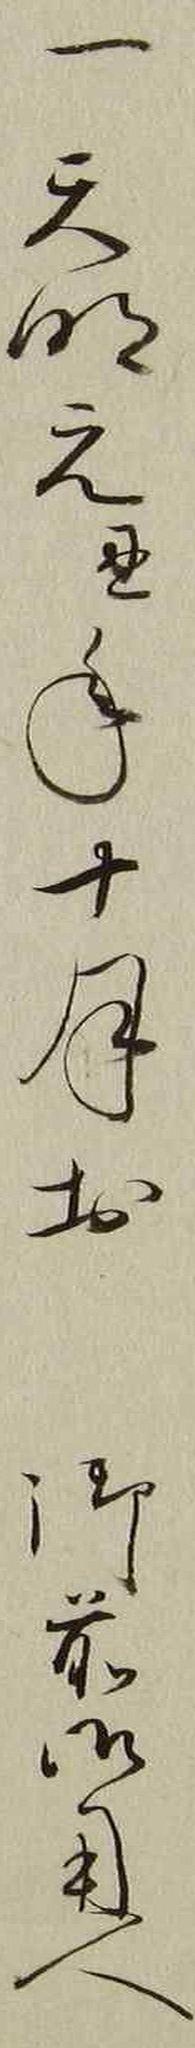一天明元丑年十月於御前御用人
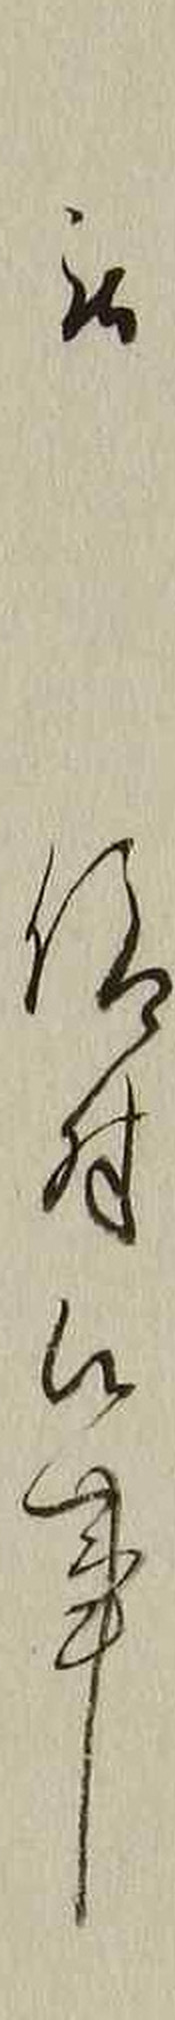被仰付候事
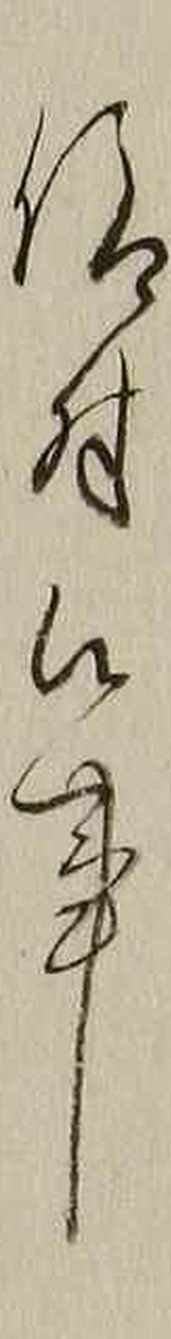仰付候事
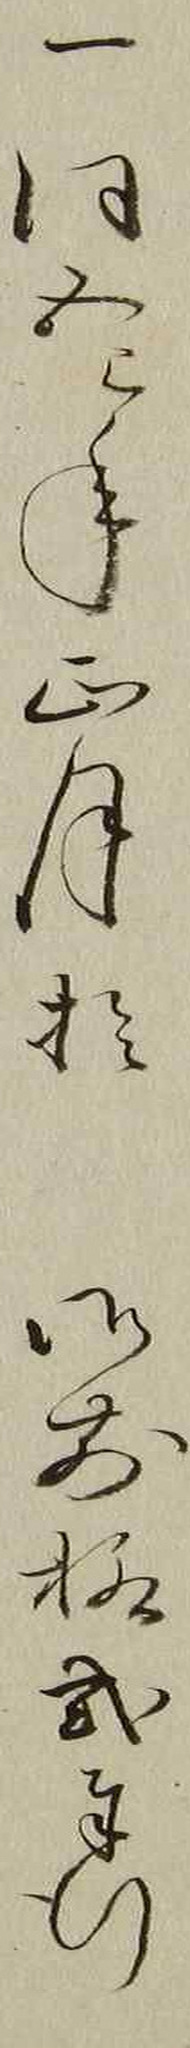一同五巳年正月於御前格式奉行
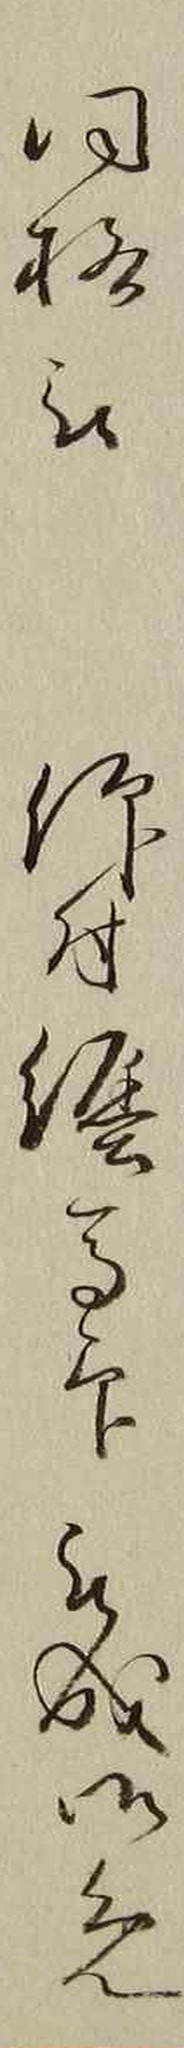同格被仰付纏馬印被成御免
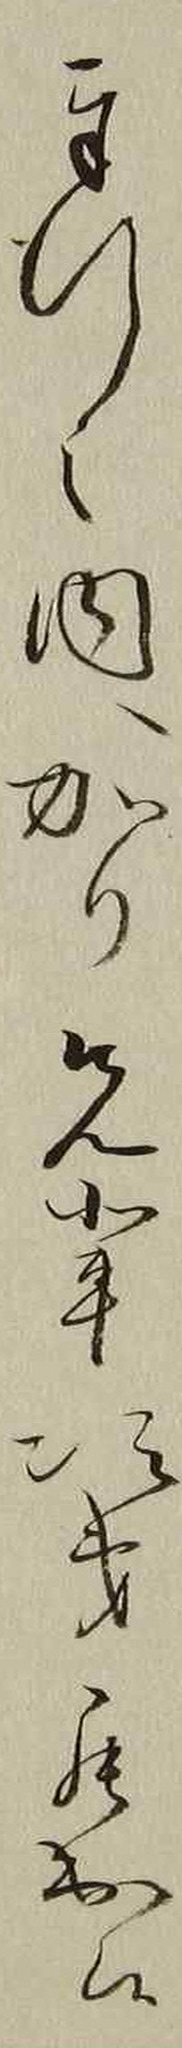奉行之内へ加り先輩次第罷出候
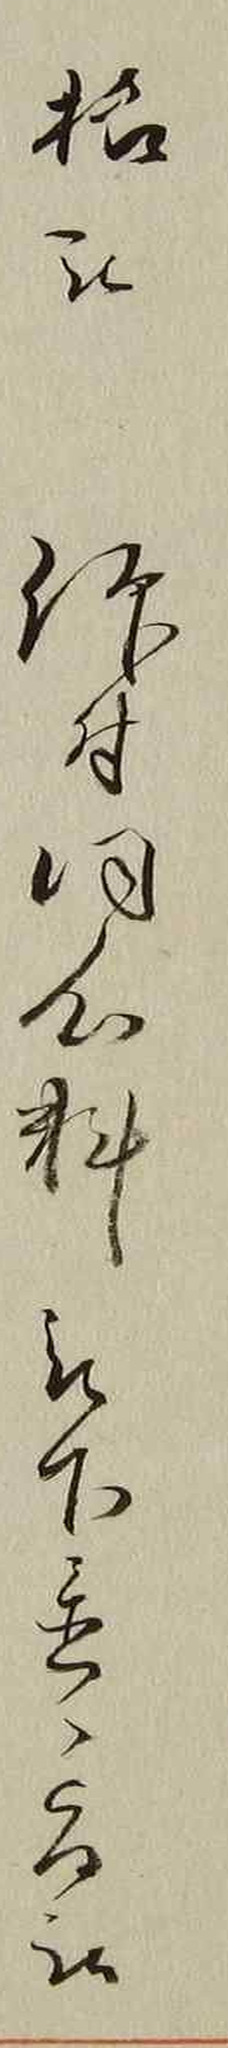様被仰付同心料被下置候旨被
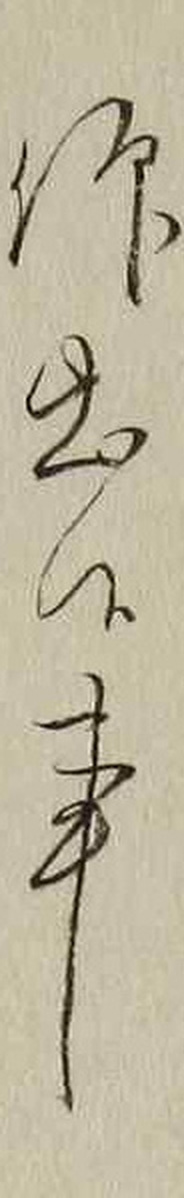仰出候事
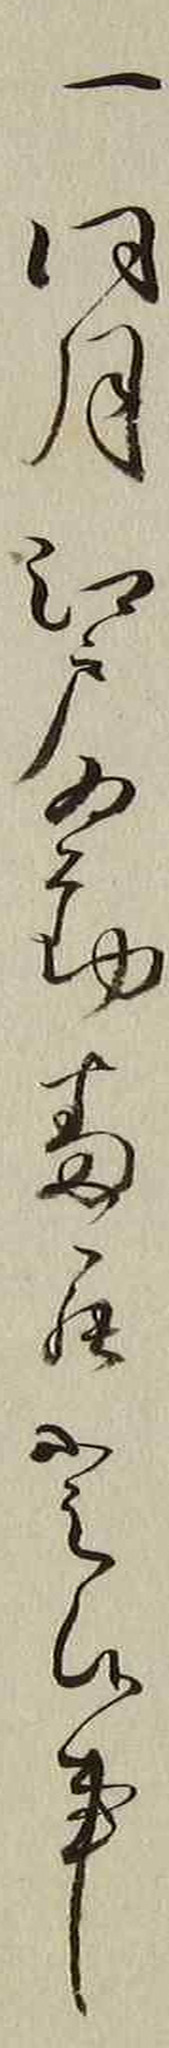一同月江戸為勤番罷登候事
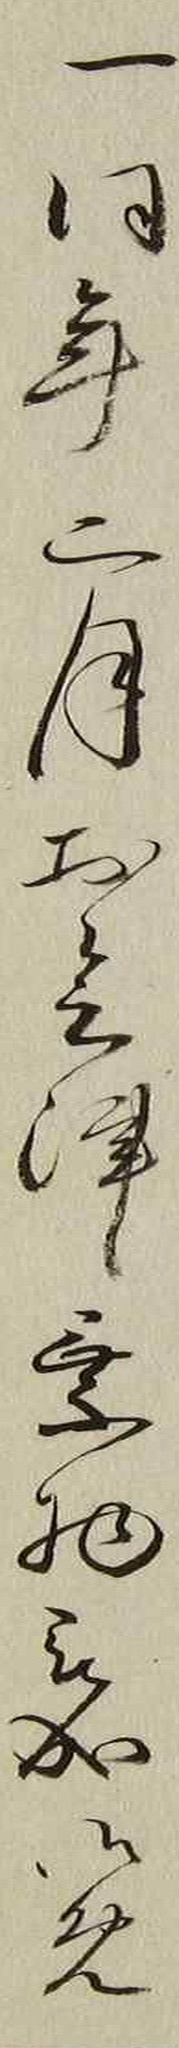一同年二月於会津乗物被成御免
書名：諸士系譜　巻之2　い之部2
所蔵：会津若松市立会津図書館
